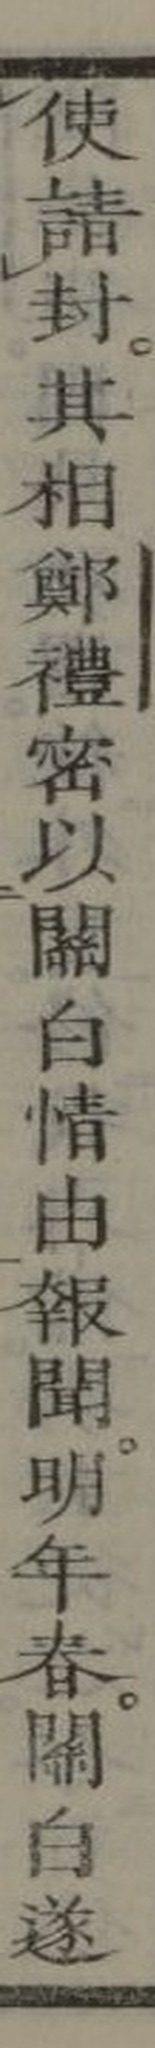使請封。其相鄭禮密以關白情由報聞。明年春。關白遂
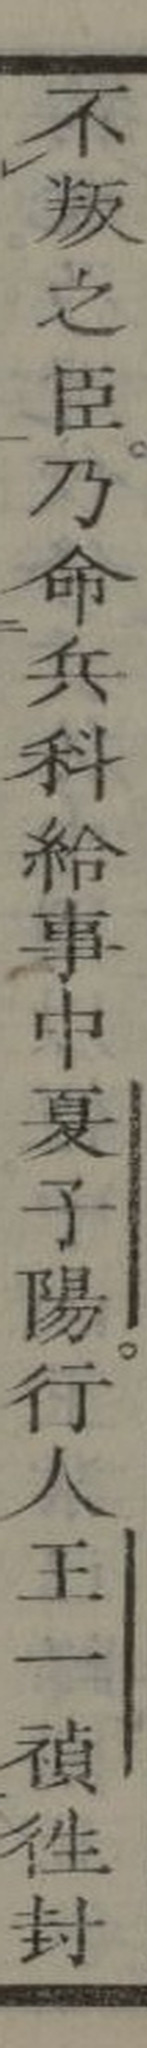不叛之臣。乃命兵科給事中夏子陽。行人王一禎徃封
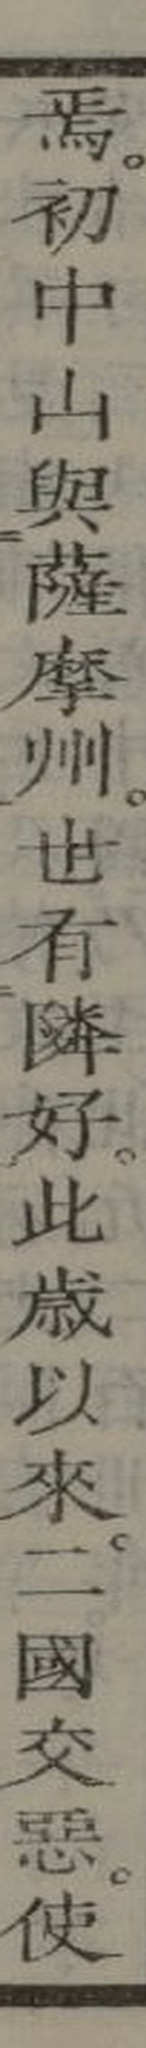焉。初中山與薩摩州。世有隣好。此歳以來。二國交惡。使
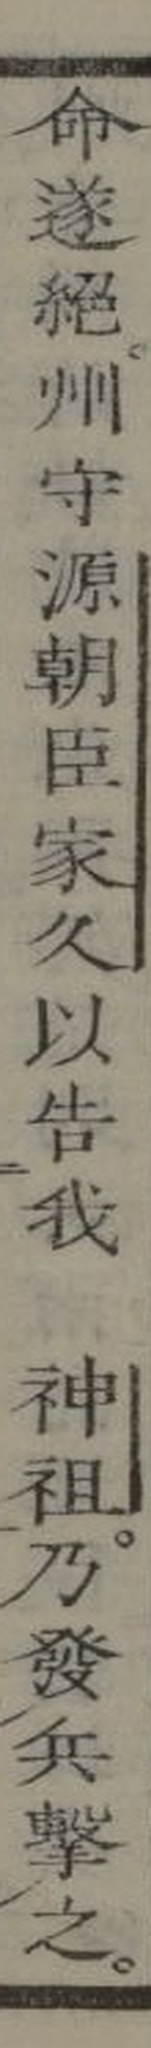命遂絕。州守源朝臣家久以告我神祖。乃發兵撃之。
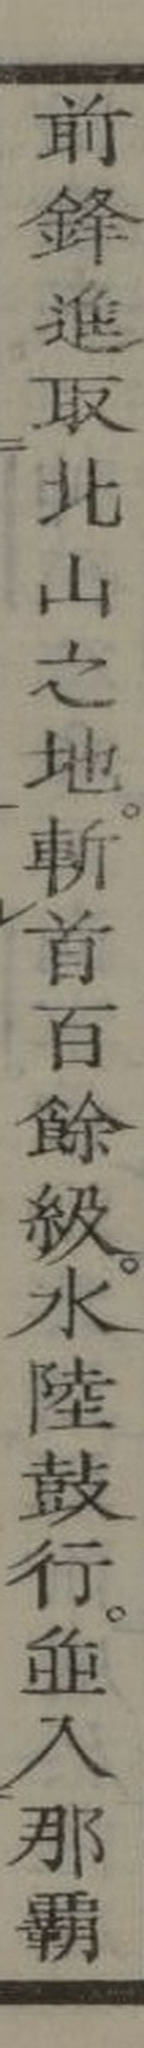前鋒進取北山之地。斬首百餘級。水陸鼓行。並入那覇
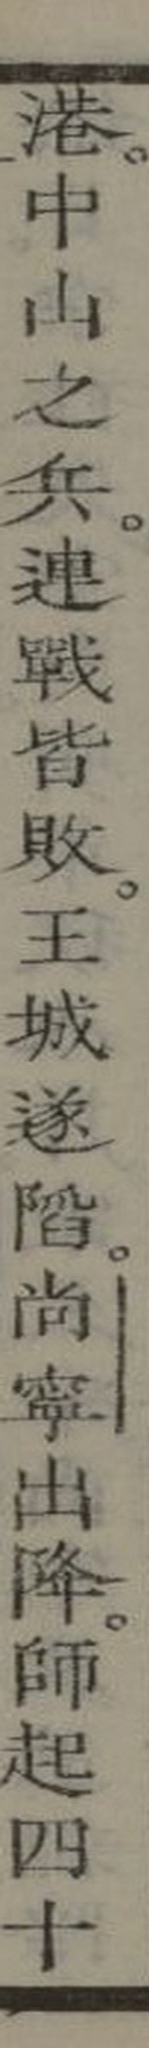港。中山之兵。連戰皆敗。王城遂陷。尚寧出降。師起四十

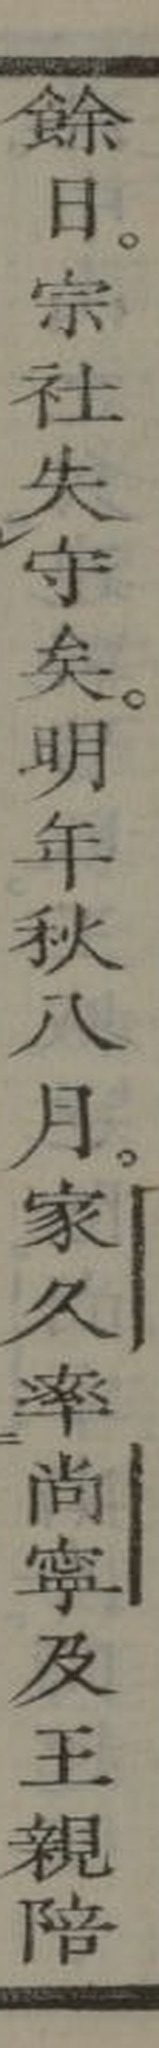餘日。宗社失守矣。明年秋八月。家久率尚寧及王親陪
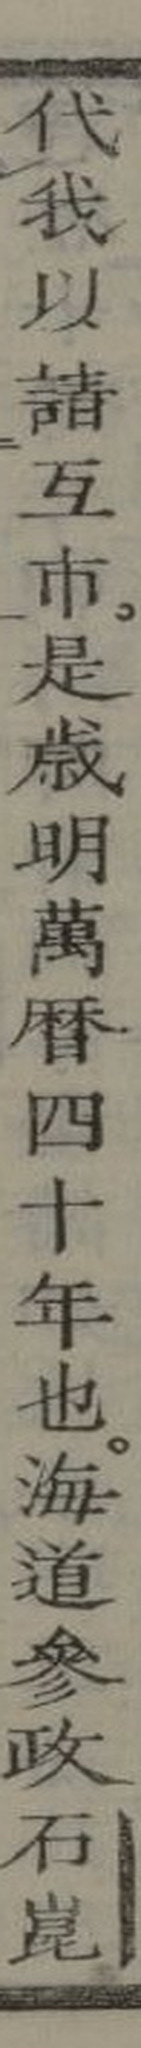代我以請互市。是歳明萬暦四十年也。海道參政石崑
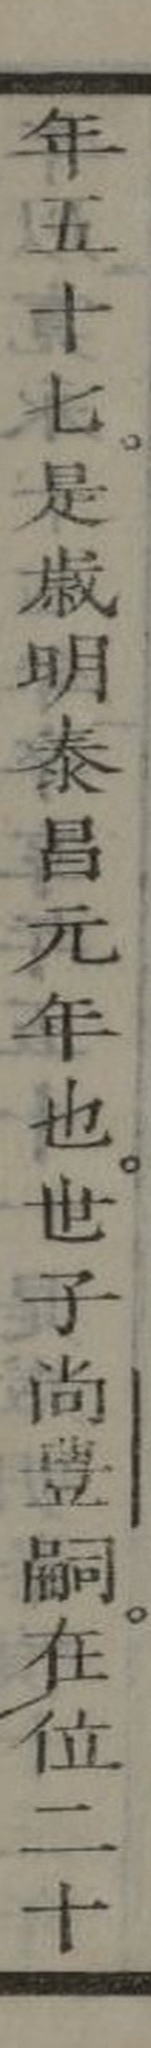年五十七。是歳明泰昌元年也。世子尚豊嗣。在位二十

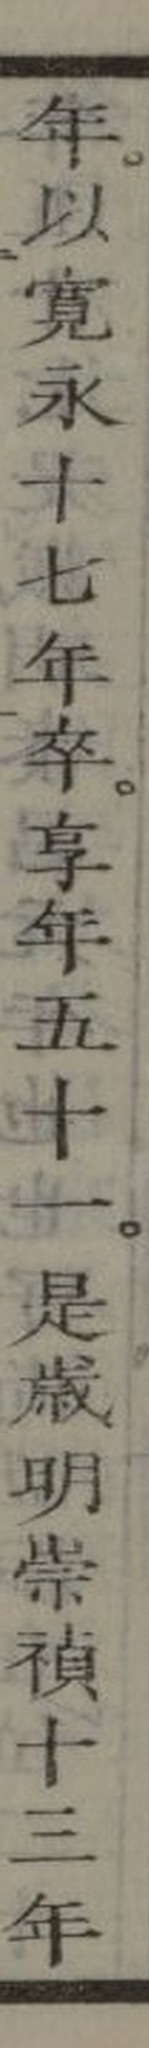年。以寛永十七年卒。享年五十一。是歳明崇禎十三年
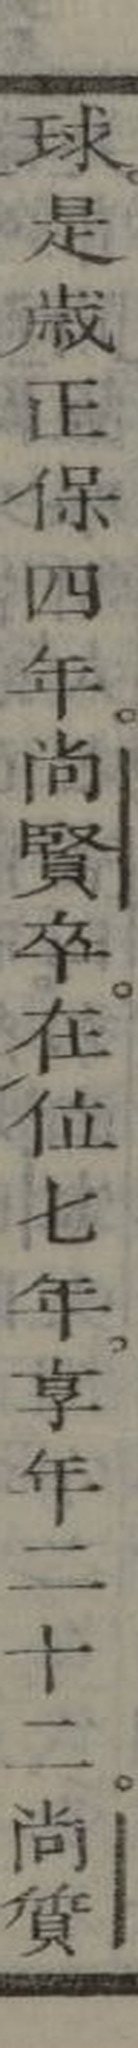球。是歳正保四年。尚賢卒。在位七年。享年二十二。尚質
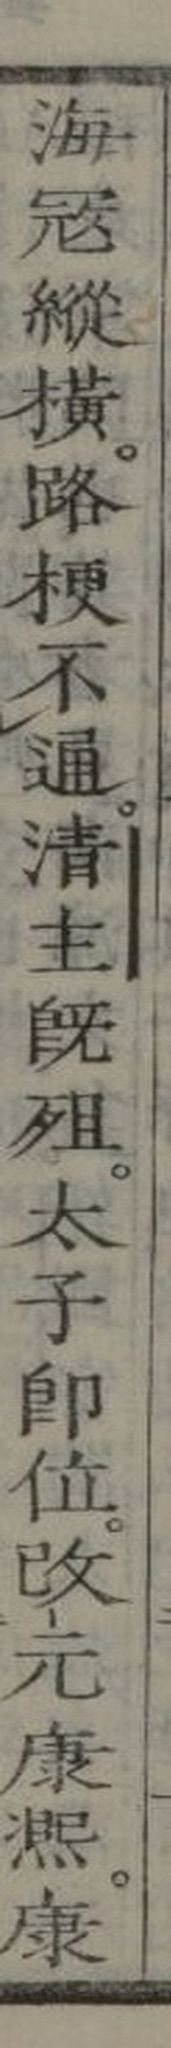海冦縱横。路梗不通。清主既殂。太子卽位。改-元康凞。康
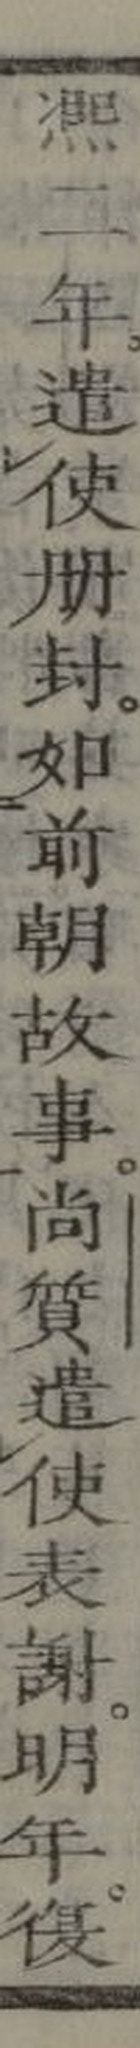凞二年。遣使册封。如前朝故事。尚質遣使表謝。明年。復
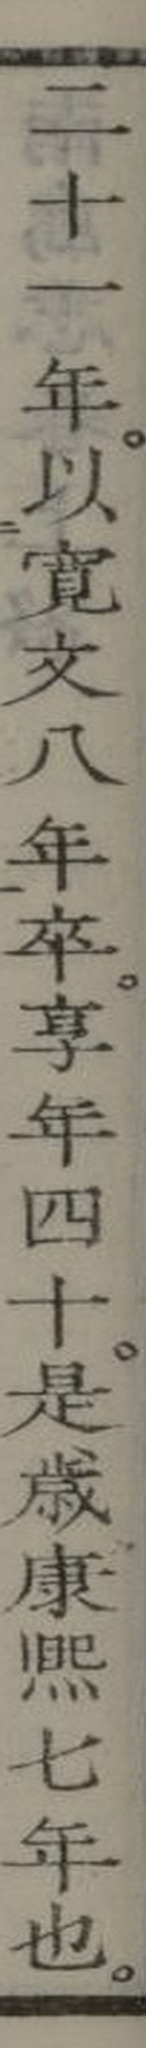二十一年。以寛文八年卒。享年四十。是歳康熈七年也。
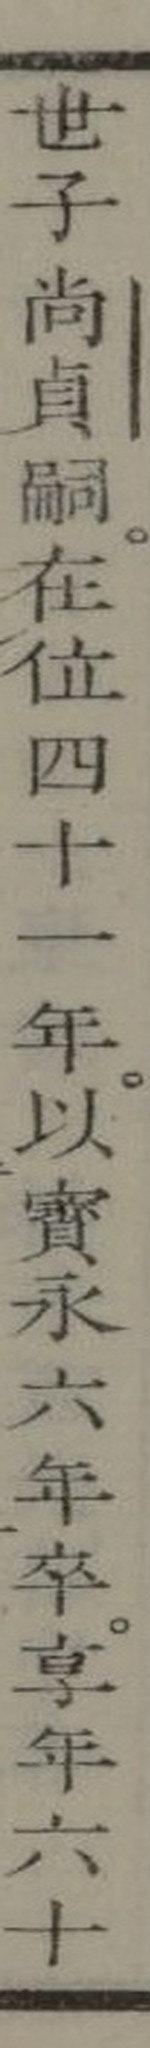世子尚貞嗣。在位四十一年。以寳永六年卒。享年六十
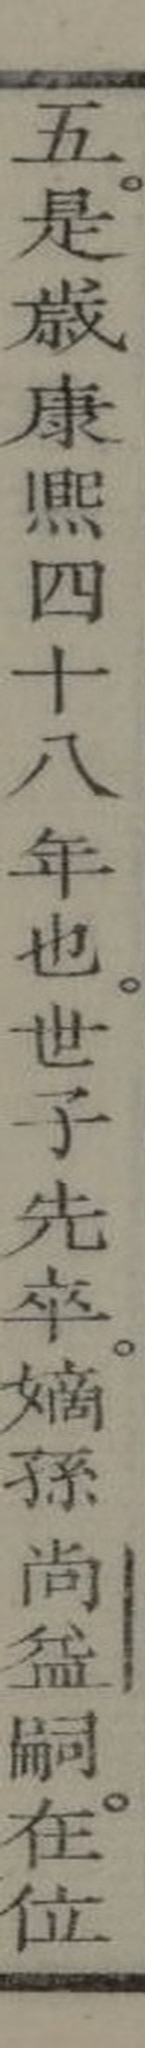五。是歳康熈四十八年也。世子先卒。嫡孫尚益嗣。在位
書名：南島志 呂
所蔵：University of the Ryukyus Library
